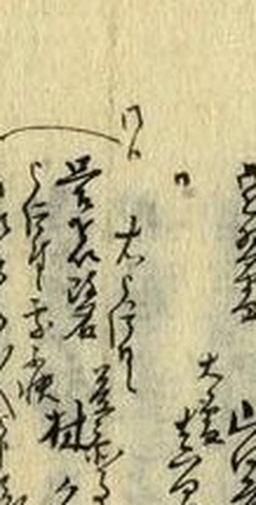同日右被仰付候
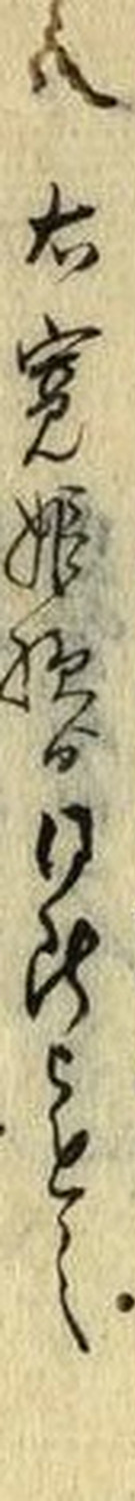右寛姫様ゟ同断被進之
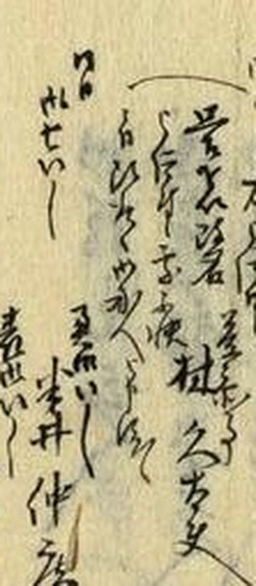二付頭取へ御用人被申渡候
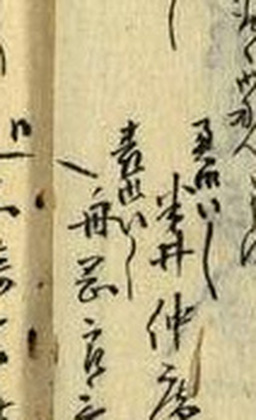表御いし
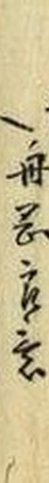船岡良意
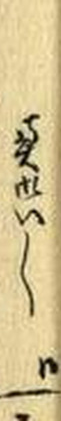表御いし
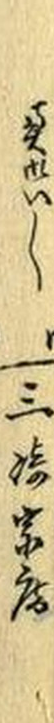奥御いし同三崎宗庵
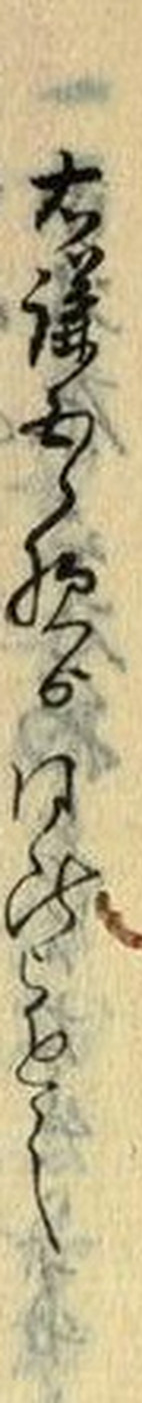右謙五郎様ゟ同断被進之
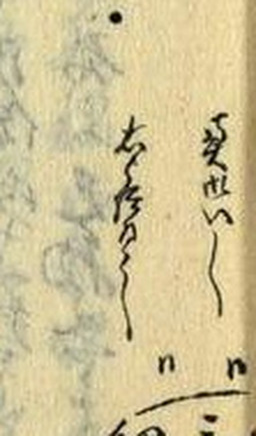右被仰付之
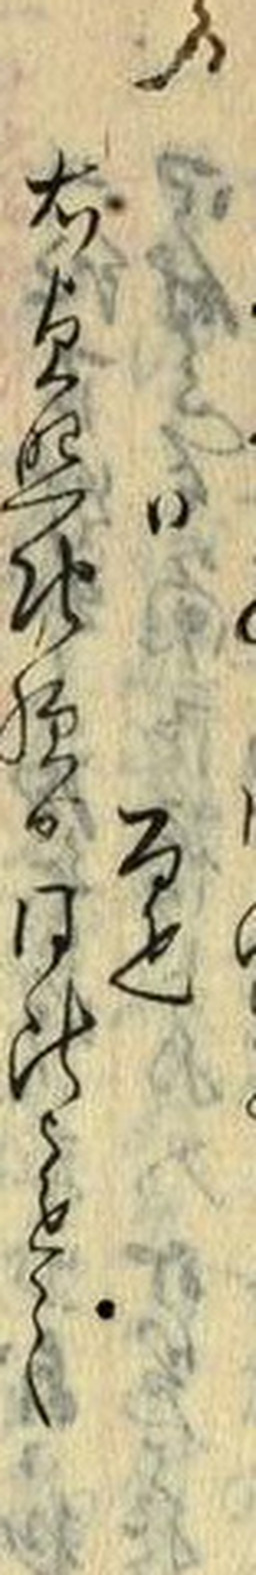右貞照院様ゟ同断被進之
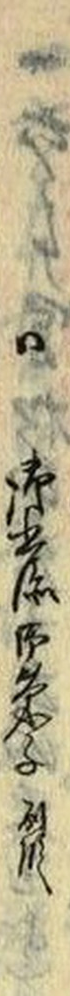同御書添御菓子別段
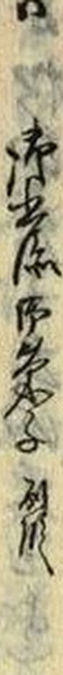同御書添御菓子別段
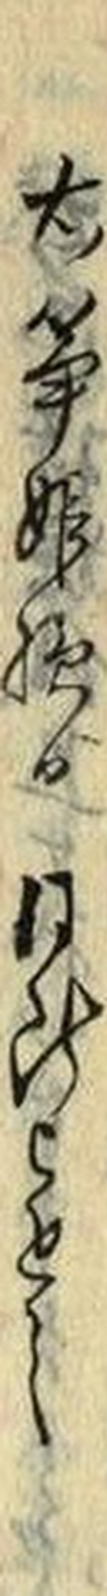右箏姫様ゟ同断被進之
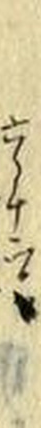六月十二日
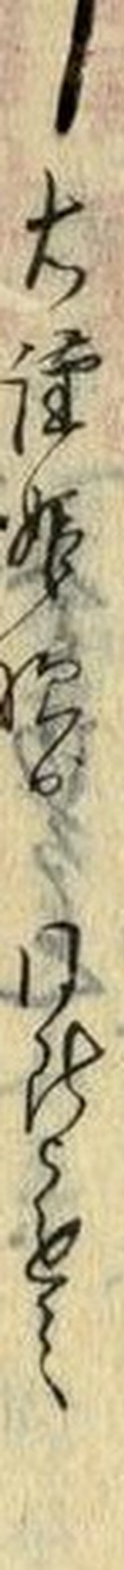右謹姫様ゟ同断被進之
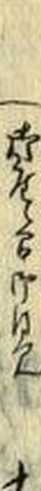御座之間御目見
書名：少傅日録抄（斉承付側向頭取日記、在国）
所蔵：福井県文書館 Fukui Prefectural Archives
